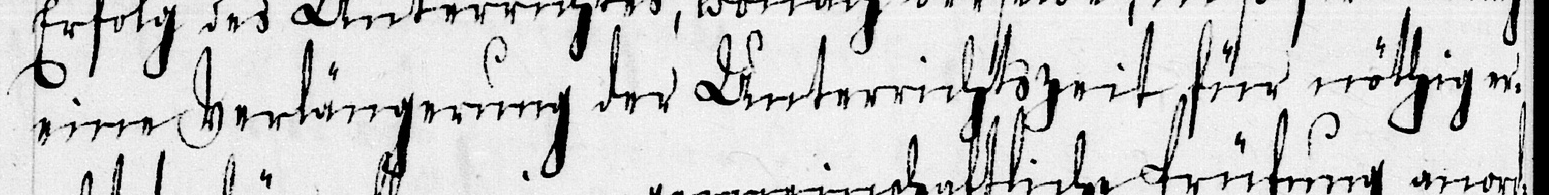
eine Verlängerung der Unterrichtszeit für nöthig er¬
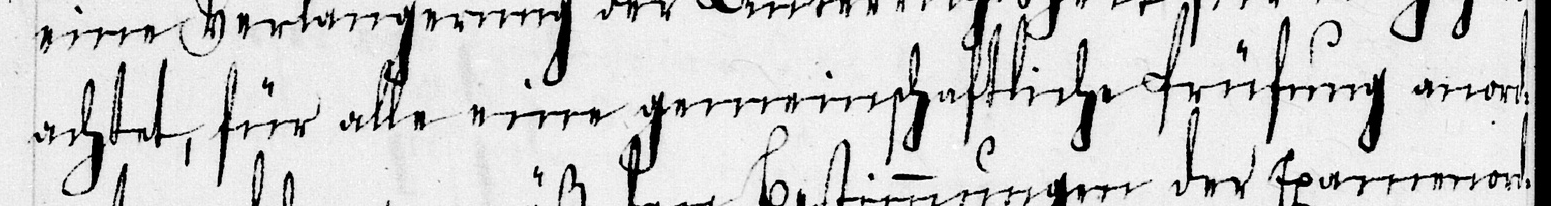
achtet, für alle eine gemeinschaftliche Prüfung anord¬
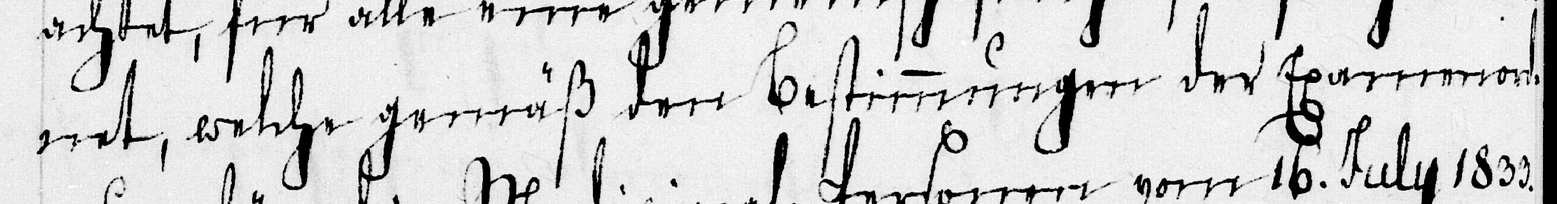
net, welche gemäß den Bestimmungen der Examenord¬
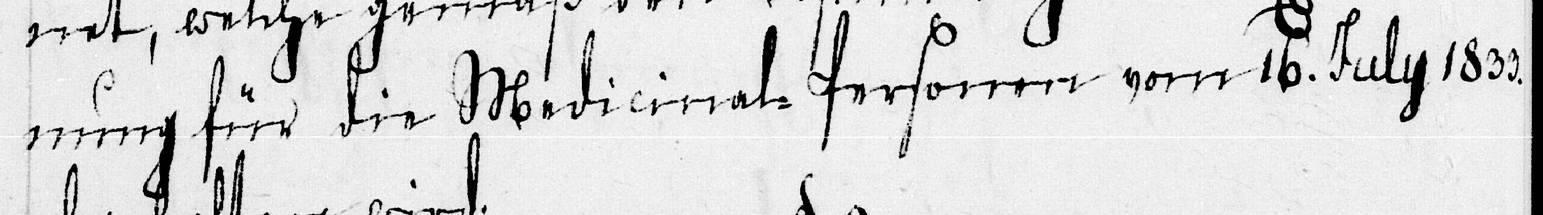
nung für die Medicinal-Personen vom 16. July 1833.
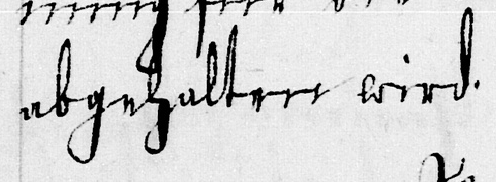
abgehalten wird.
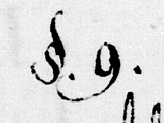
§. 9.
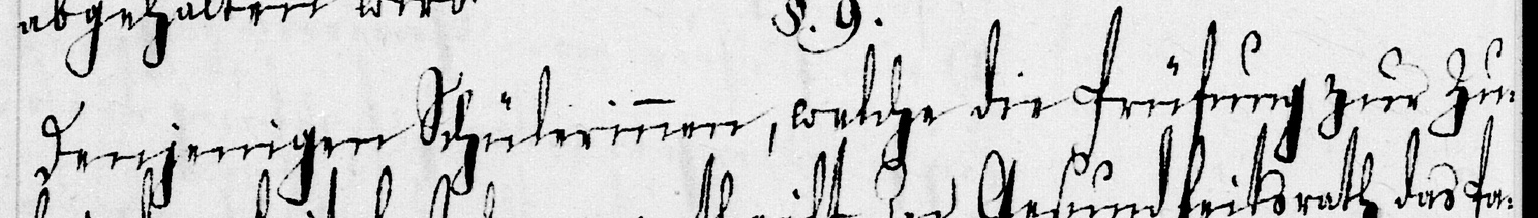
Denjenigen Schülerinnen, welche die Prüfung zur Zu¬
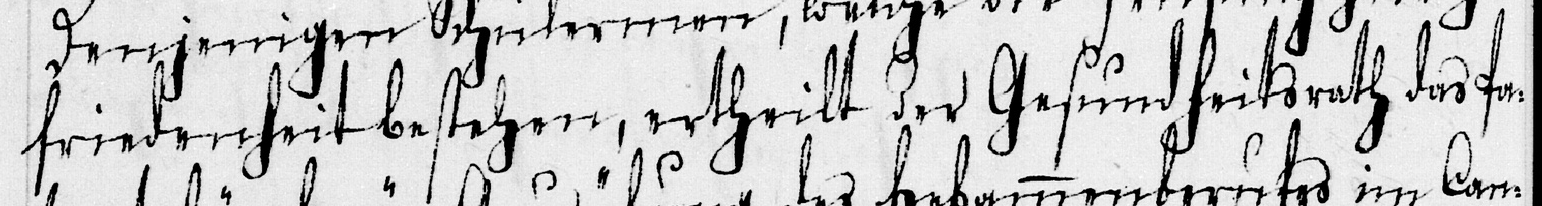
friedenheit bestehen, ertheilt der Gesundheitsrath das Pa¬
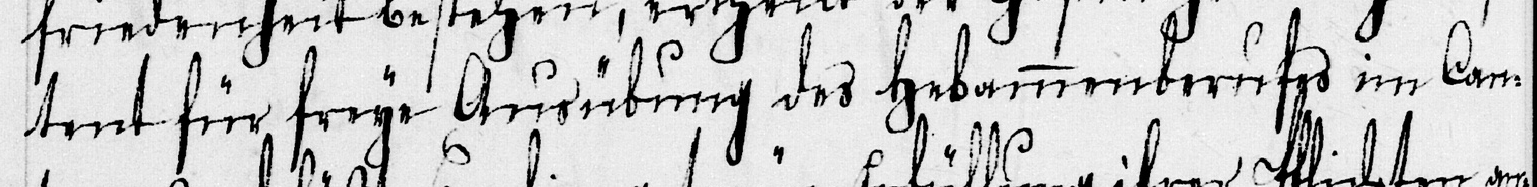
tent für freye Ausübung des Hebammenberufes im Can¬
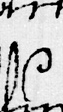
3.
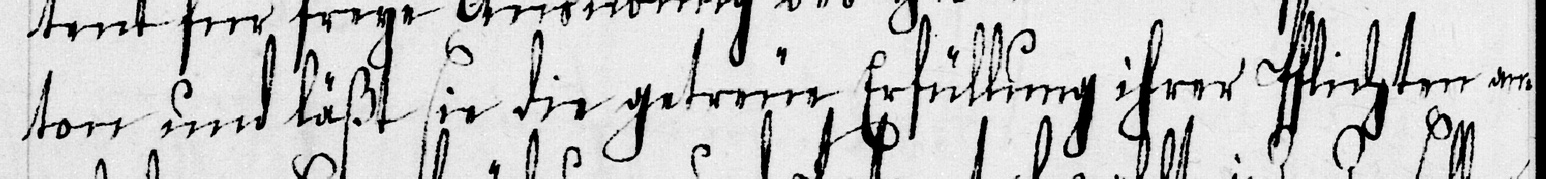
ton und läßt sie die getreue Erfüllung ihrer Pflichten an¬
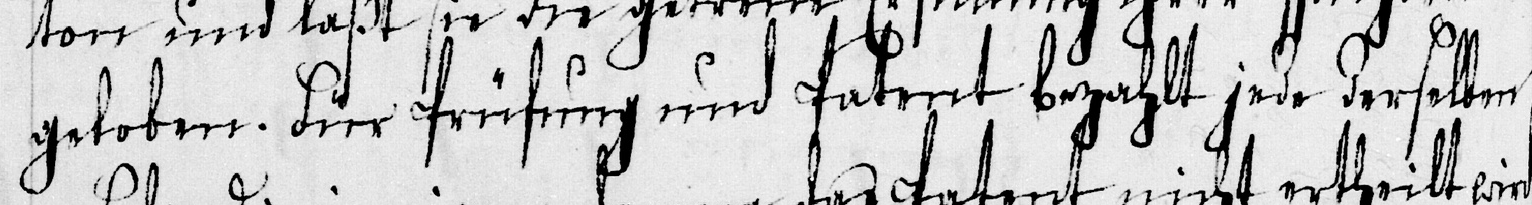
geloben. Für Prüfung und Patent bezahlt jede derselben
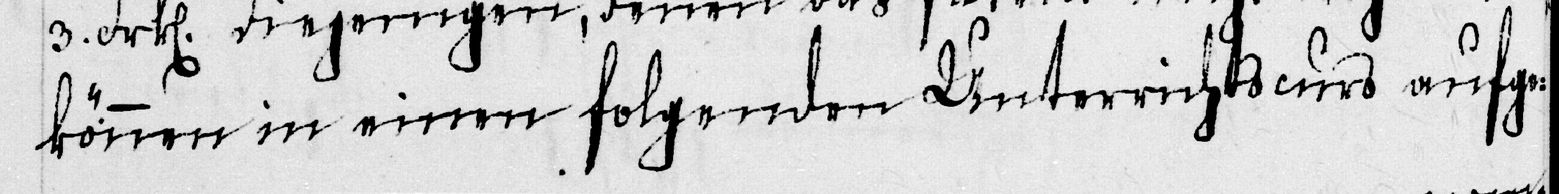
können in einem folgenden Unterrichtscurs aufge-
